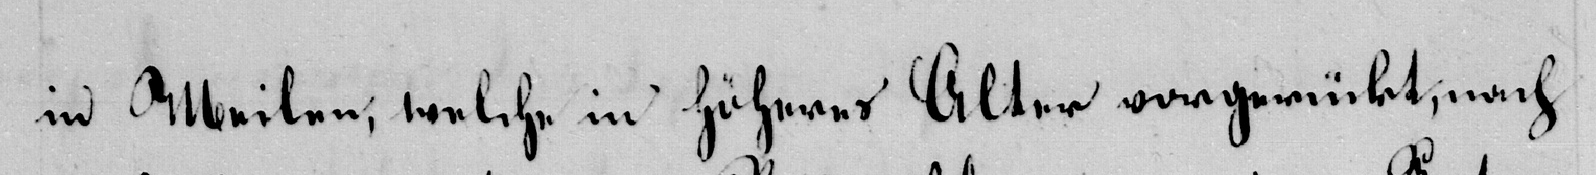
in Meilen, welche in höheres Alter vorgerückt, nach
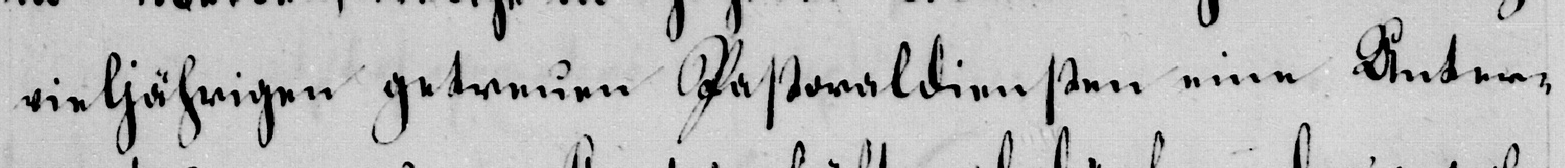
vieljährigen getreuen Pastoraldiensten eine Unter¬
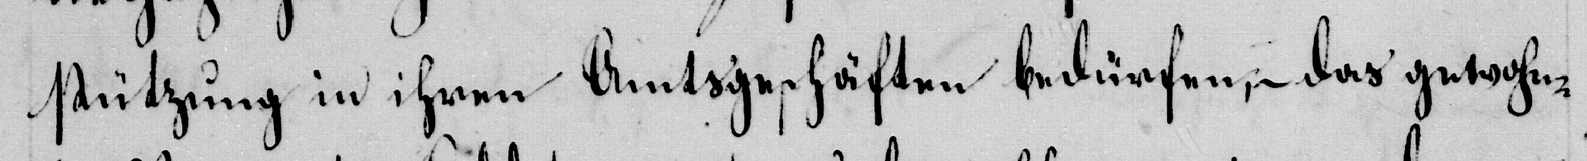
stützung in ihren Amtsgeschäften bedürfen, – das gewohn¬
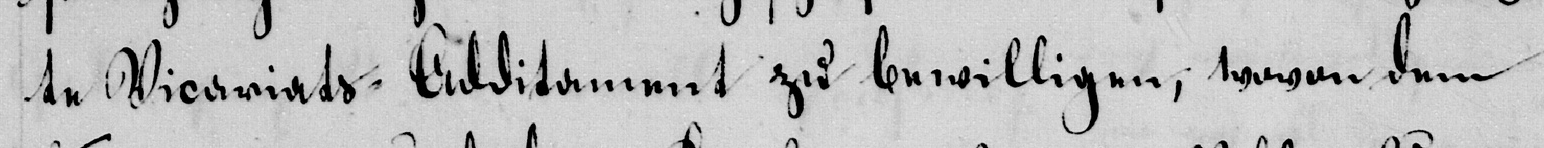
te Vicariats-Additament zu bewilligen, wovon dem
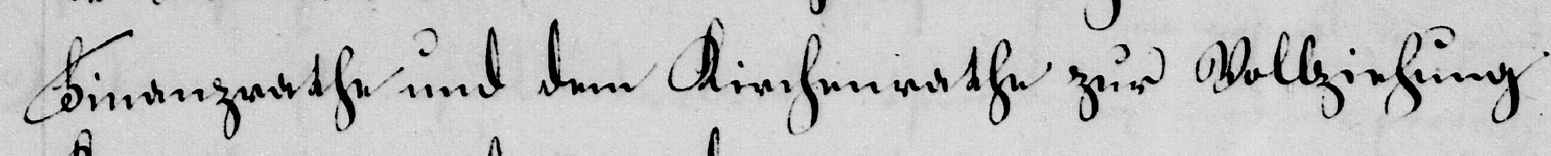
Finanzrathe und dem Kirchenrathe zur Vollziehung
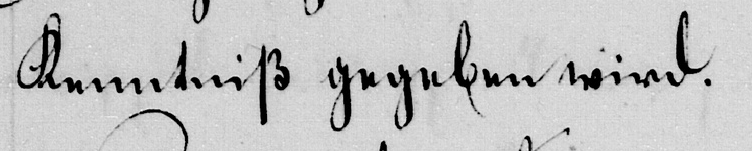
Kenntniß gegeben wird.
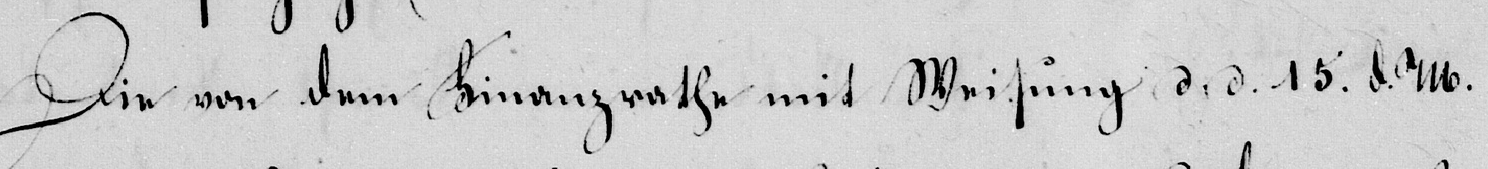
Die von dem Finanzrathe mit Weisung d. d. 15. d. M.
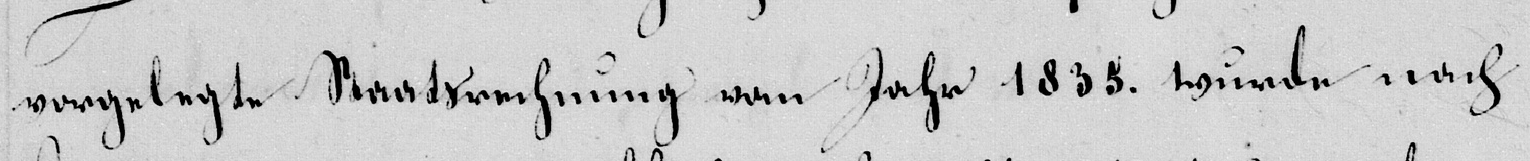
vorgelegte Staatsrechnung vom Jahr 1835. wurde nach
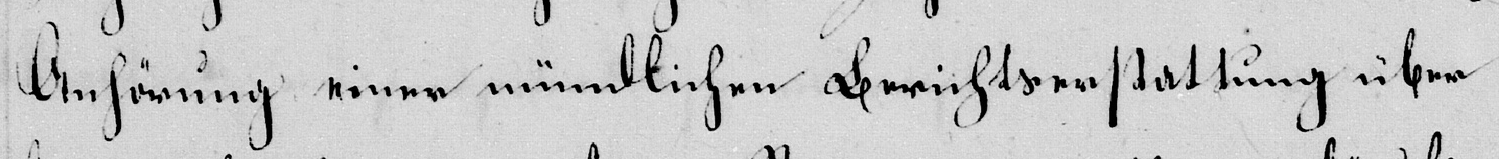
Anhörung einer mündlichen Berichtserstattung über
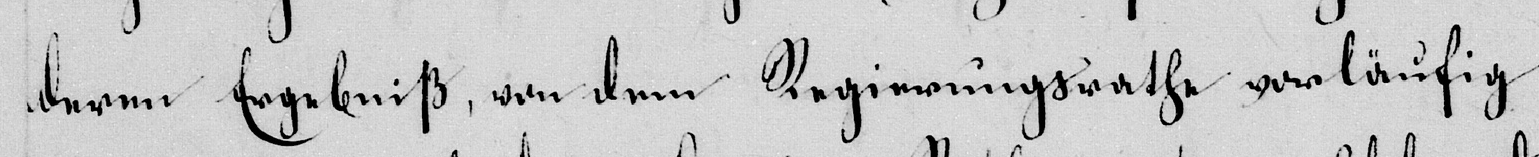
deren Ergebniß von dem Regierungsrathe vorläufig
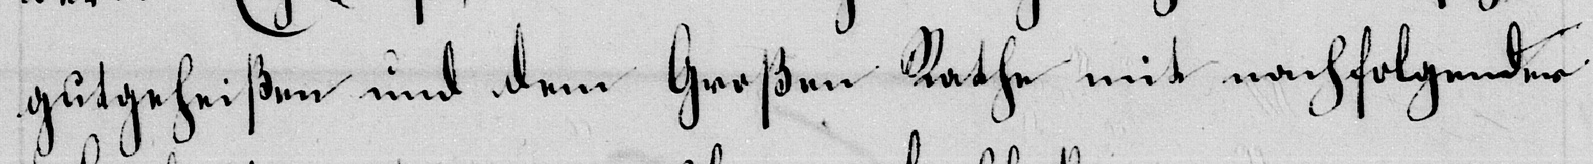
gutgeheißen und dem Großen Rathe mit nachfolgender
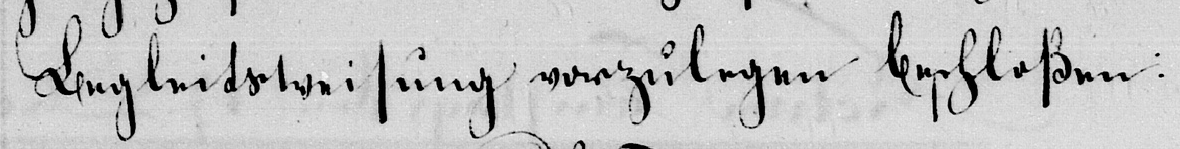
Begleitsweisung vorzulegen beschloßen:
